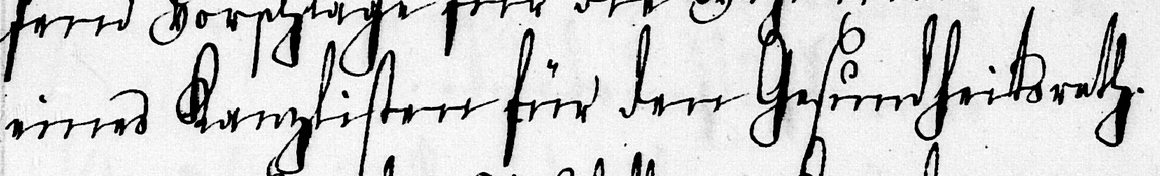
eines Kanzlisten für den Gesundheitsrath.
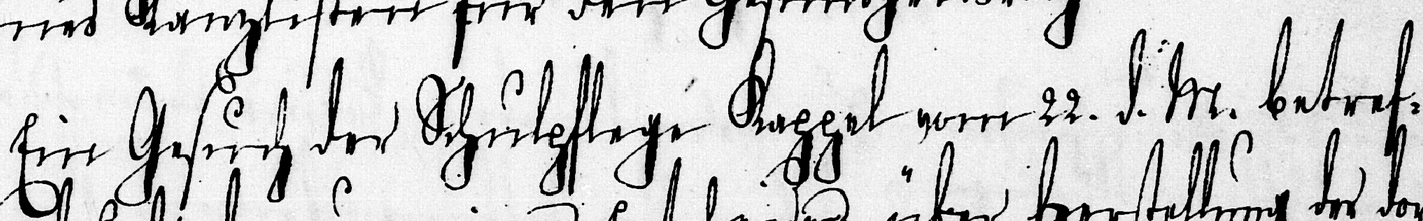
Ein Gesuch der Schulpflege Kappel vom 22. d. M. bet¬
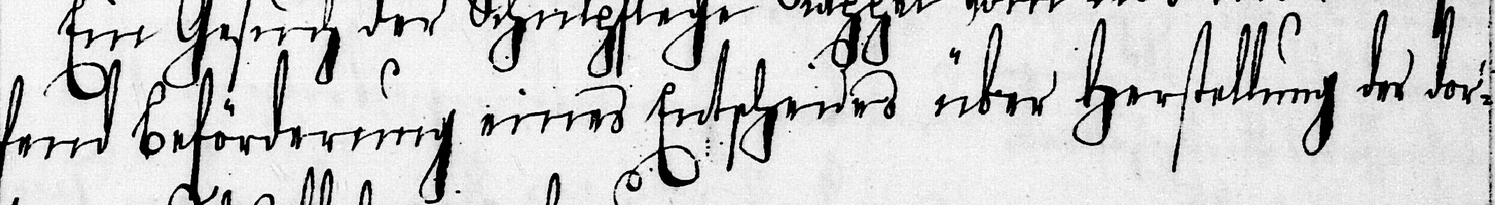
fend Beförderung eines Entscheides über Herstellung der dor¬
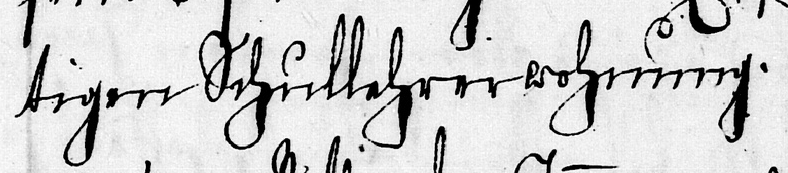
tigen Schullehrerwohnung.
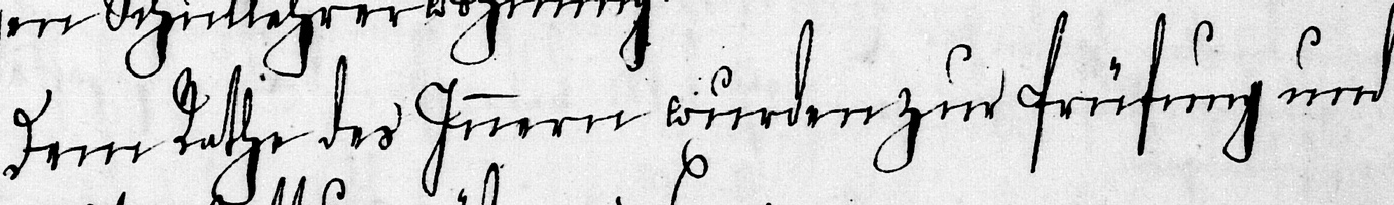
Dem Rathe des Innern wurden zur Prüfung und
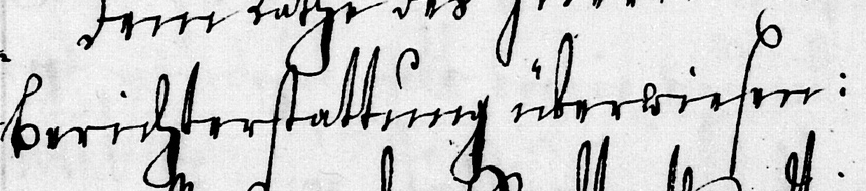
Berichterstattung überwiesen:
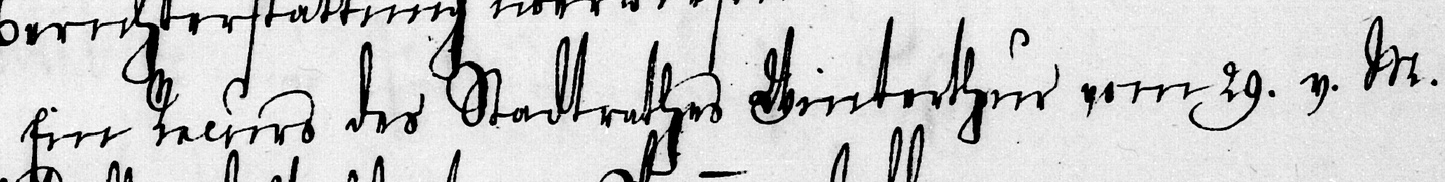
Ein Recurs des Stadtrathes Winterthur vom 29. v. M.
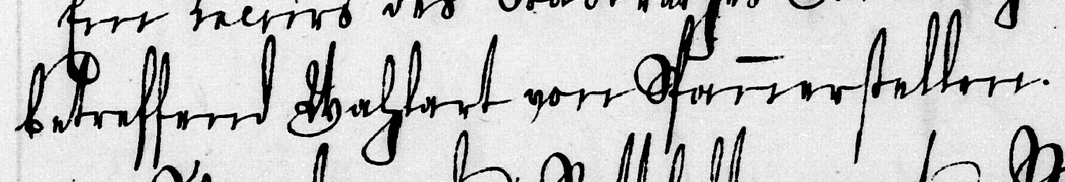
betreffend Wahlart von Spannerstellen.
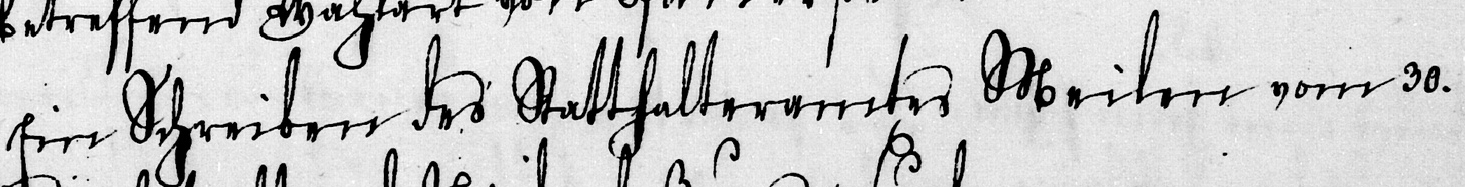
Ein Schreiben des Statthalteramtes Meilen vom 30.
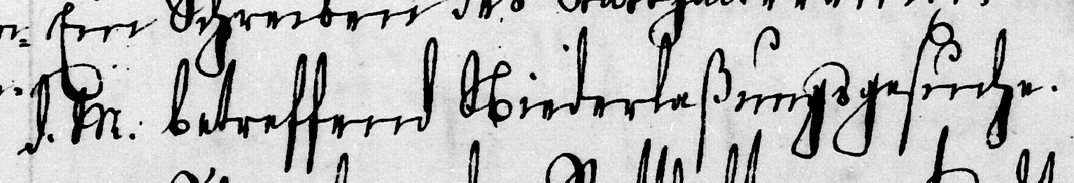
d. M. betreffend Niederlaßungsgesuche.
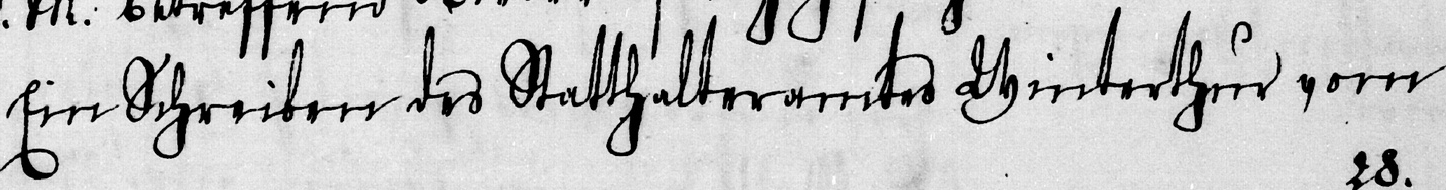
Ein Schreiben des Statthalteramtes Winterthur vom
